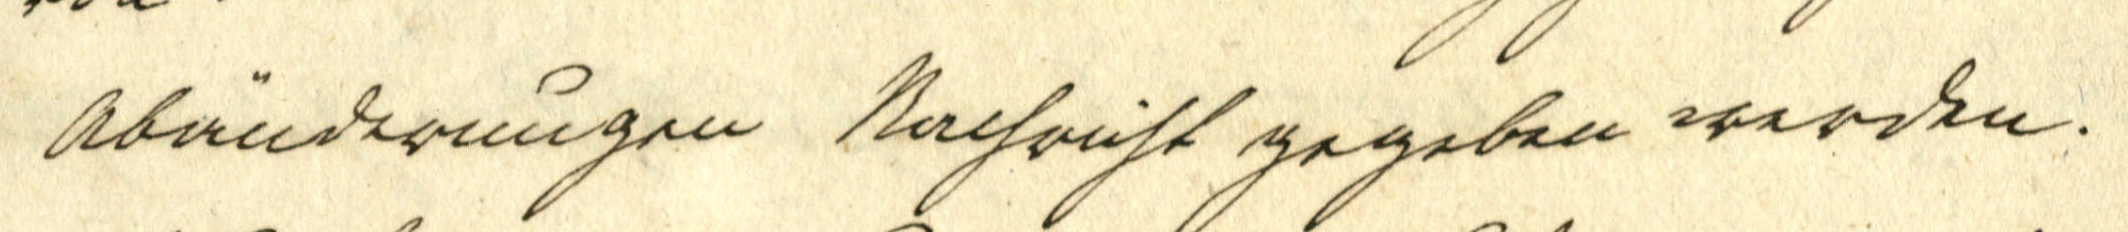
Abänderungen Nachricht gegeben werden.
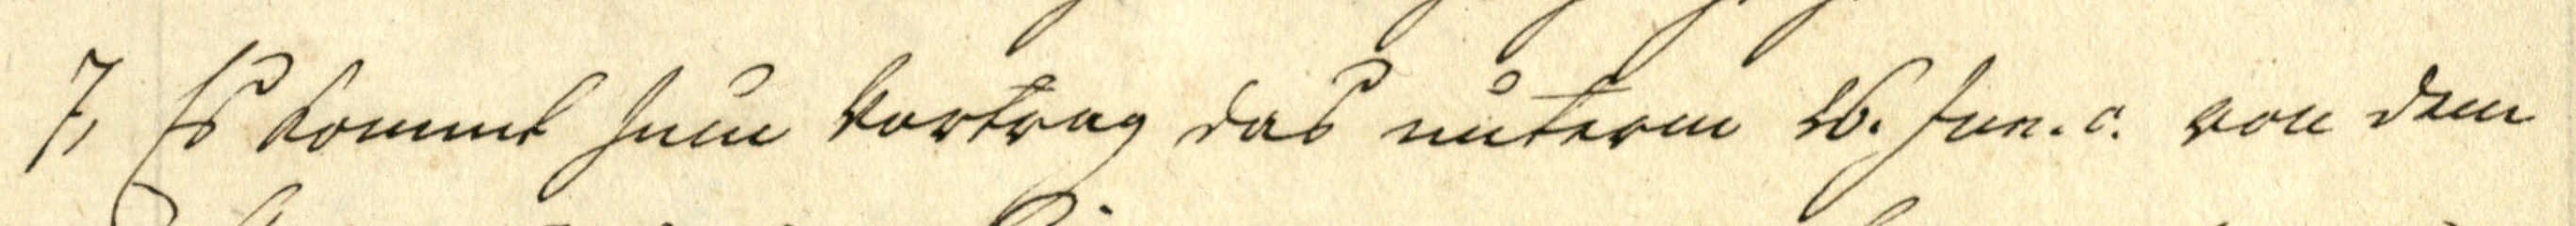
7., Es kommt zum Vortrag das unterm 26. Jun. c. von dem
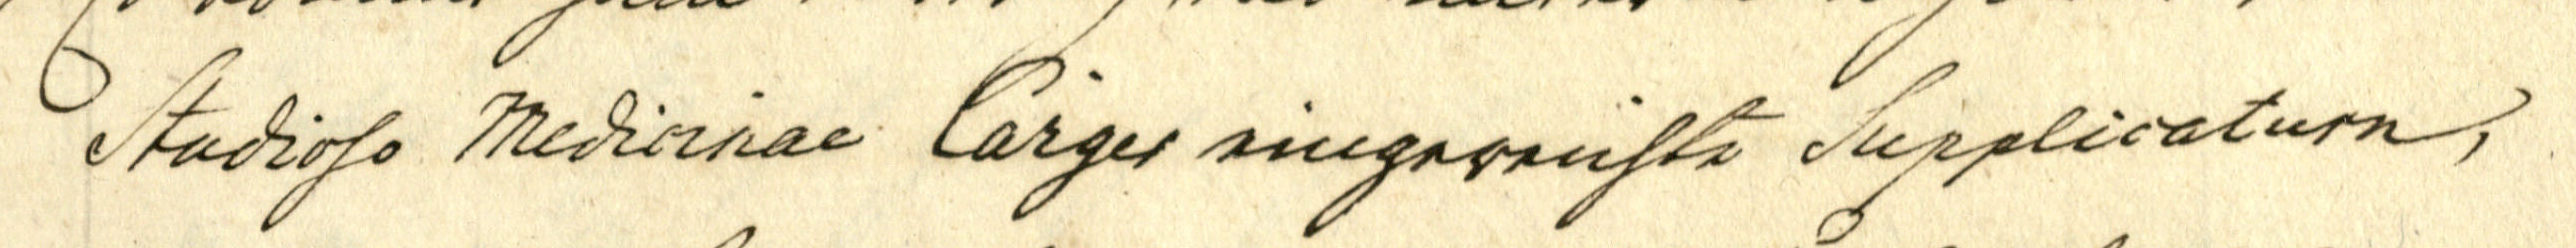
Studioso Medicinae Carger eingereichte Supplicatum,
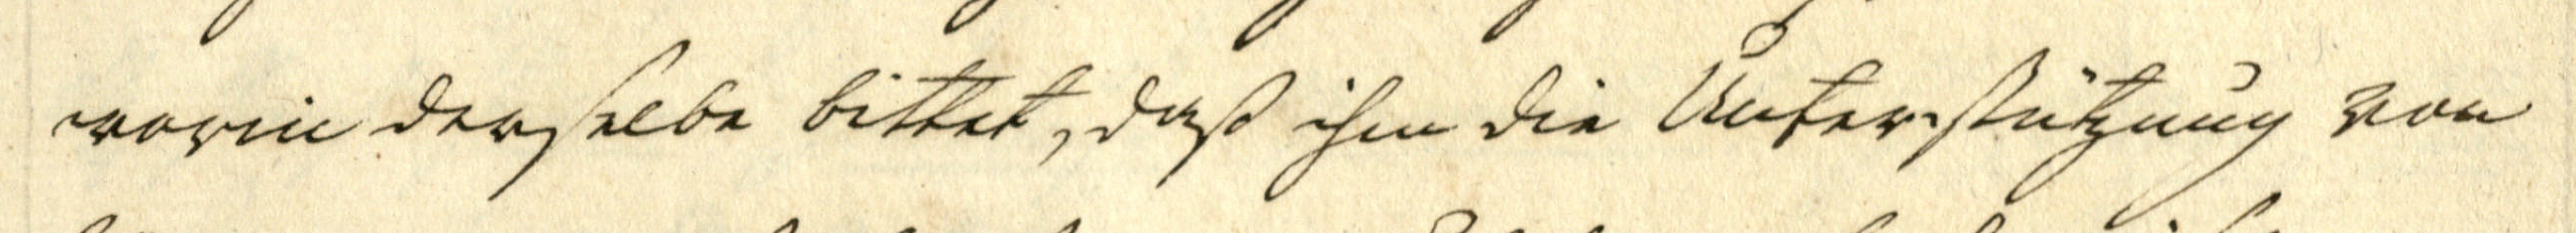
worin derselbe bittet, daß ihm die Unterstützung von
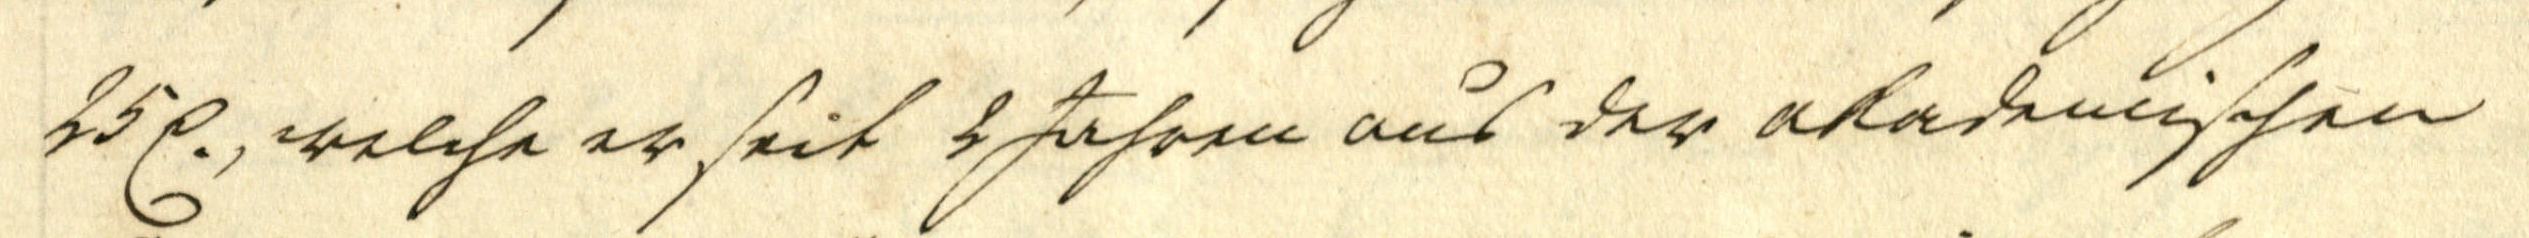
25 l., welche er seit 2 Jahren aus der akademischen
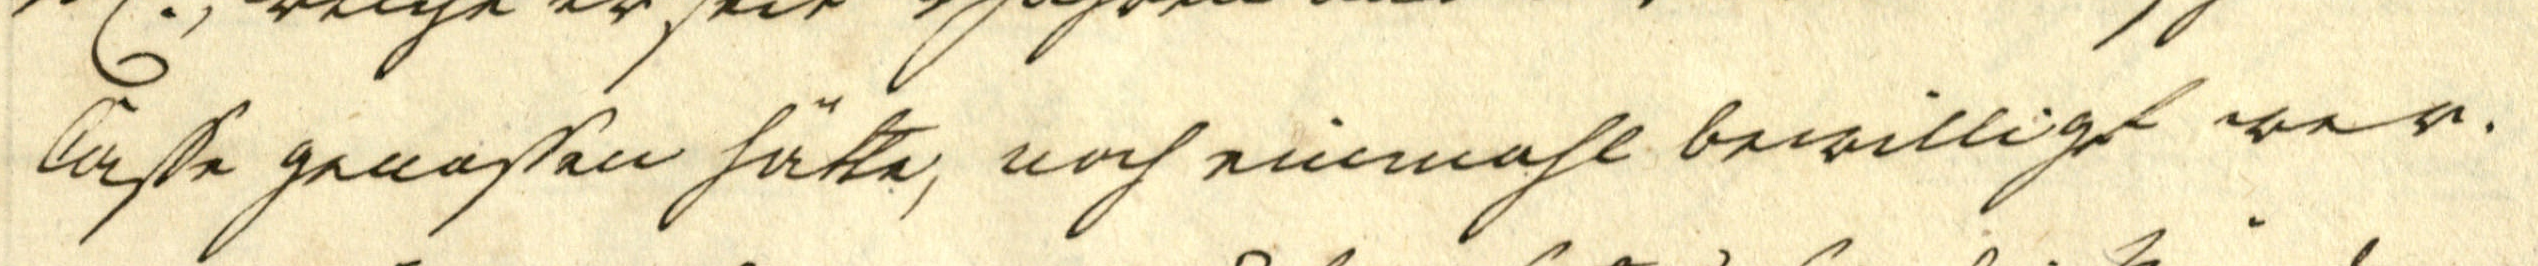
Casse genossen hätte, noch einmahl bewilligt wer¬
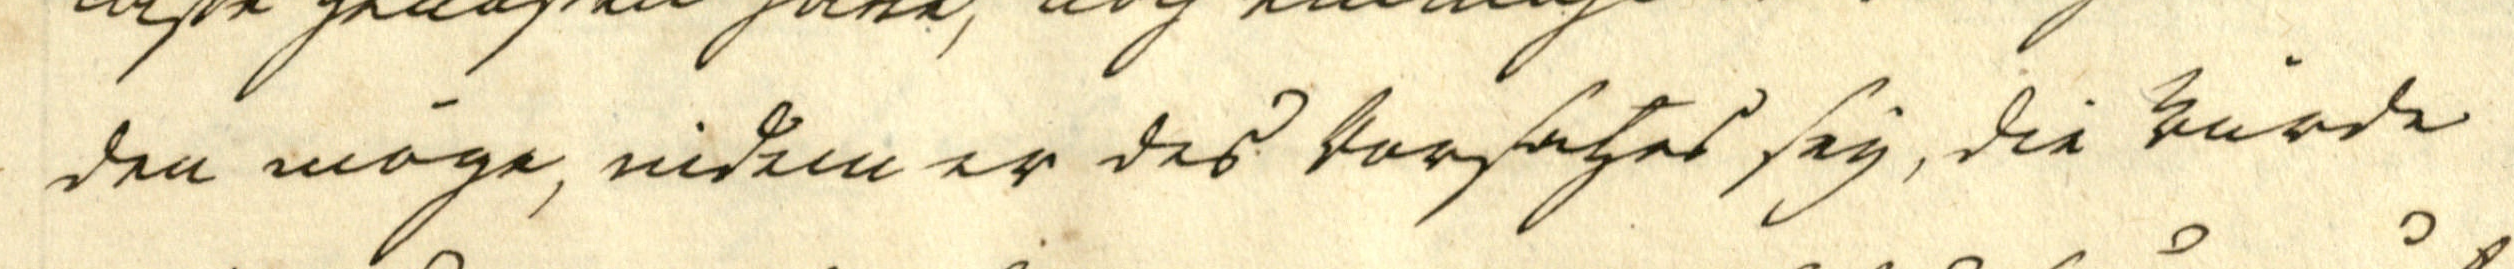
den möge, indem er des Vorsatzes seÿ, die Würde
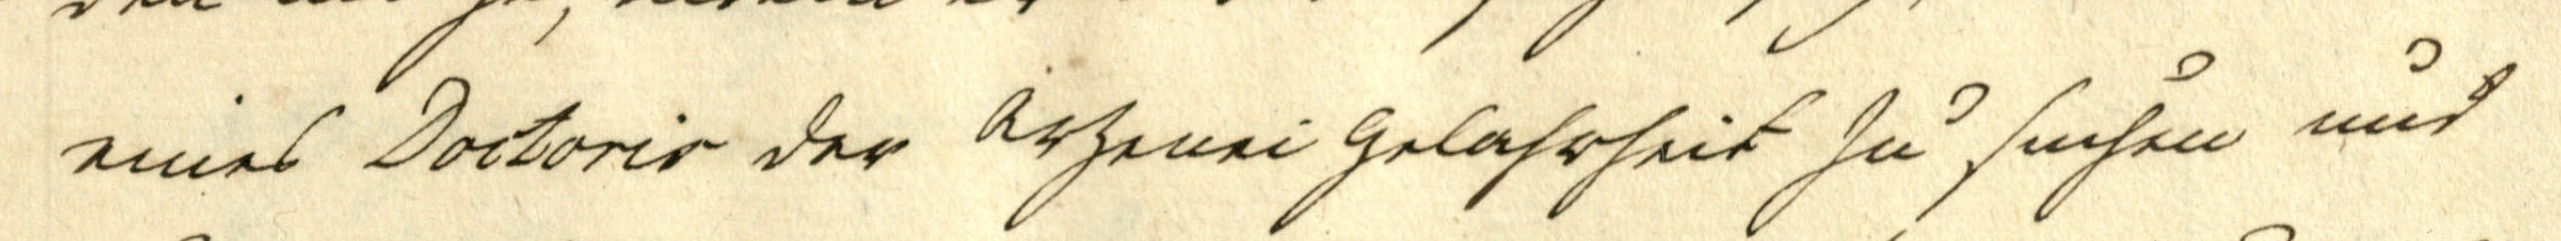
eines Doctoris der Arzenei Gelahrheit zu suchen und
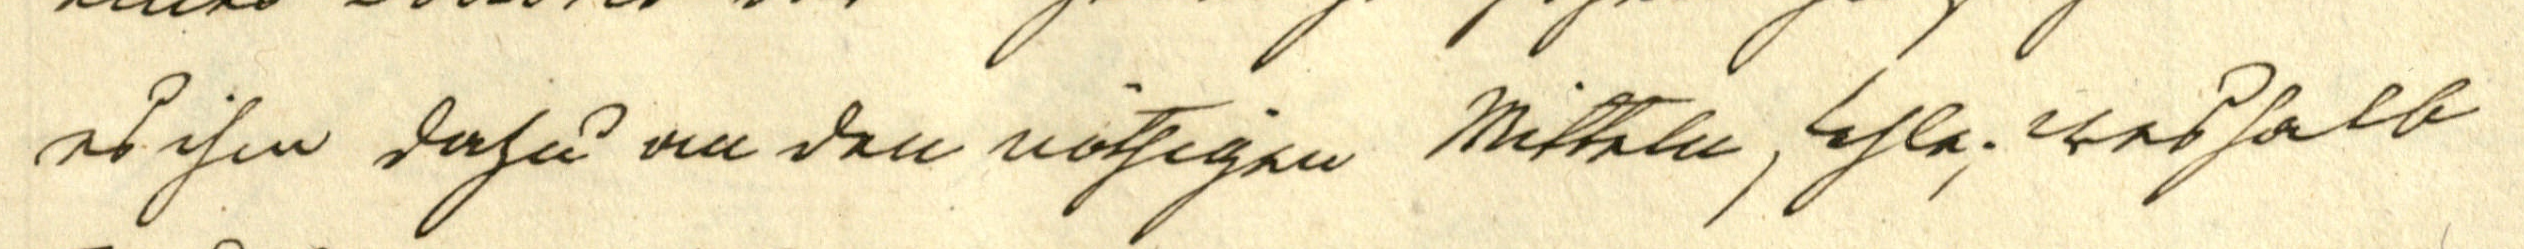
es ihm dazu an den nöthigen Mitteln fehle; weshalb
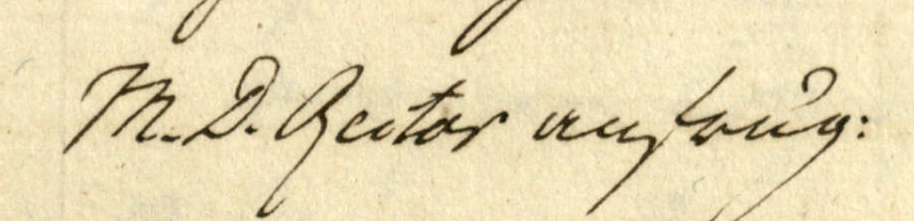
M. D. Rector anfrug:
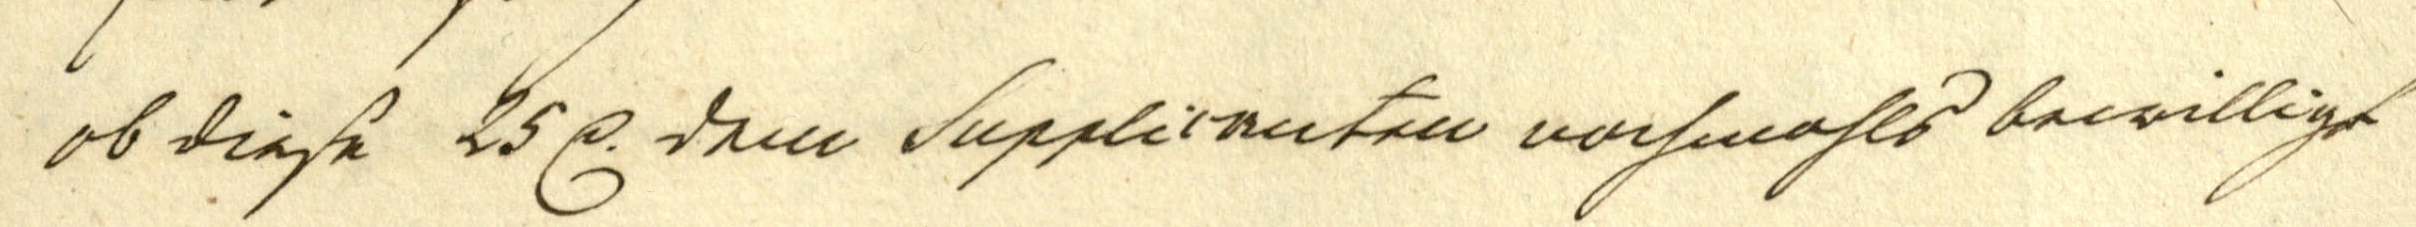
ob diese 25 l. dem Supplicanten nochmahls bewilligt
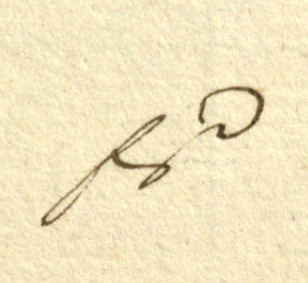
Es
